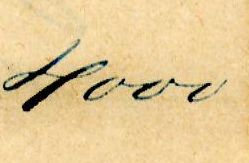4000
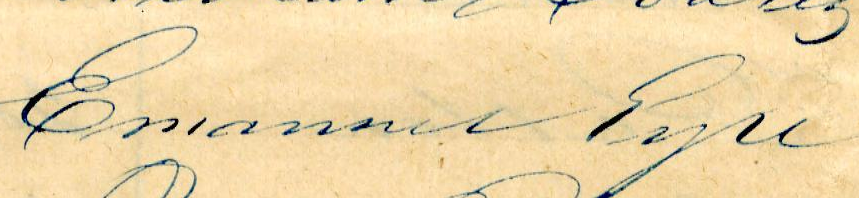Emanuel Pryce
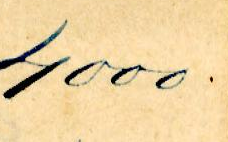4000
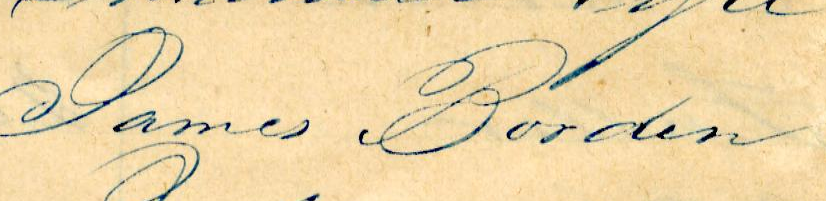James Borden
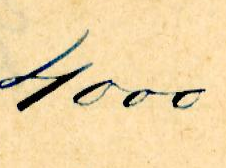4000
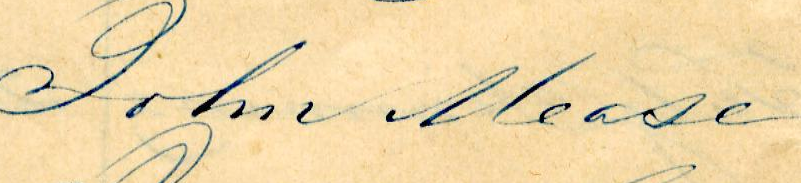John Mease
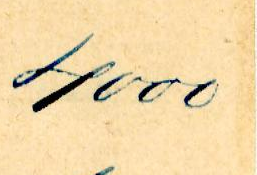4000
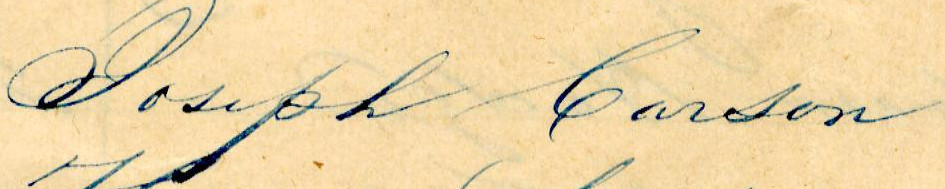Joseph Carson
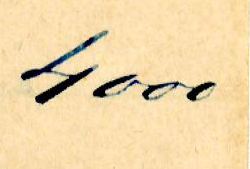4000
